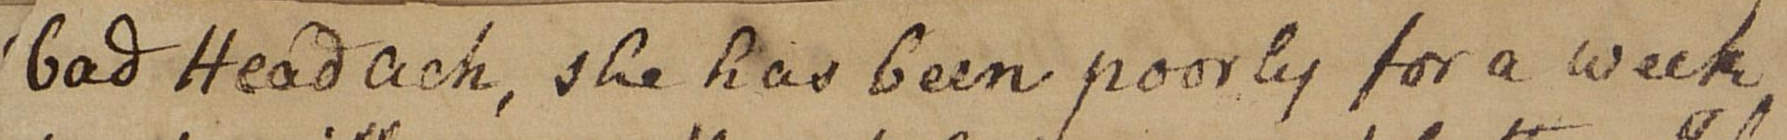bad Head ach, she has been poorly for a week
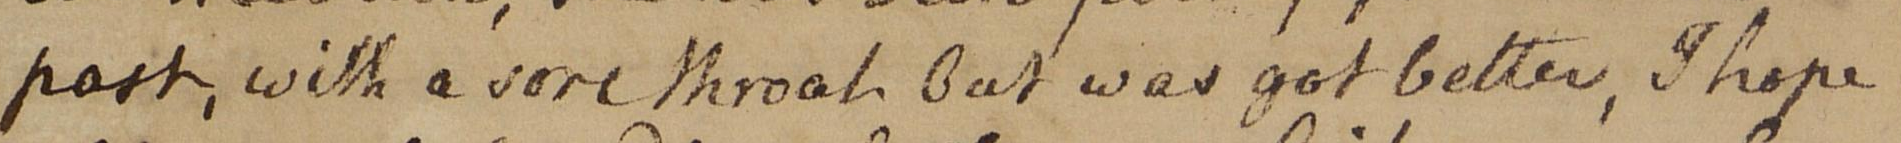past, with a sore throat but was got better, I hope
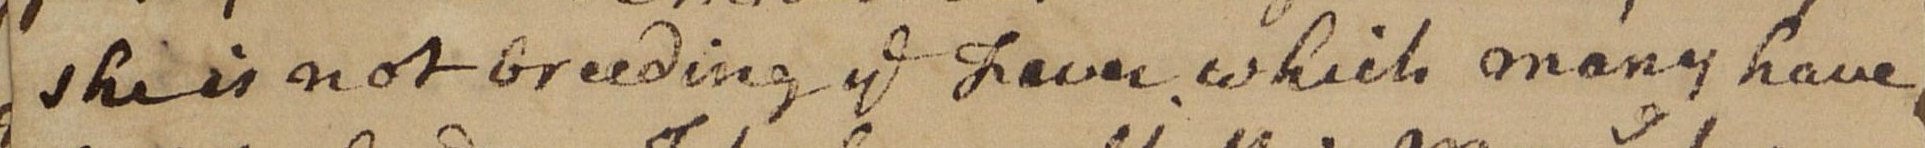she is not breeding y^e Fever, which many have
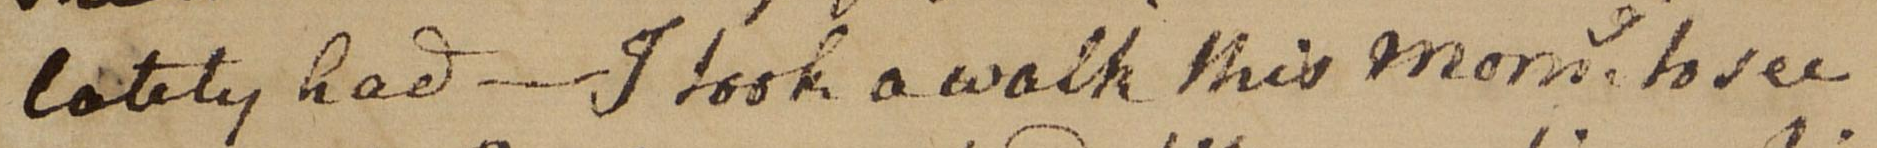lately had- I took a walk this Morn^g. to see
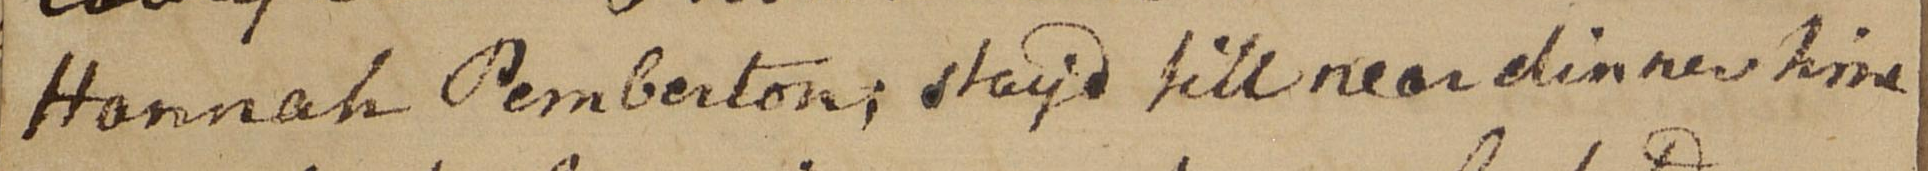Hannah Pemberton; stay'd till near dinner time
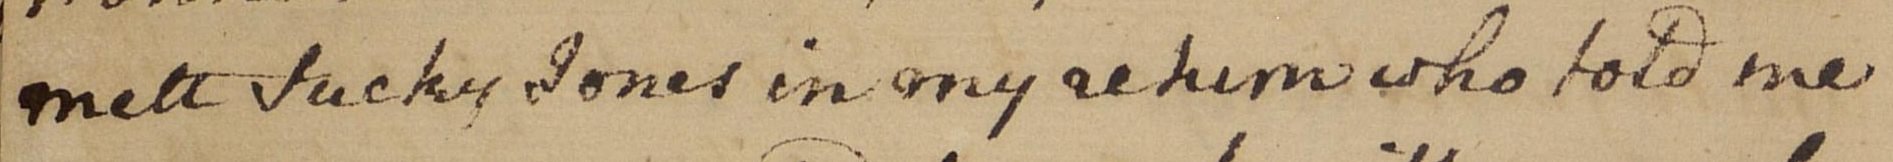mett Sucky Jones in my return who told me
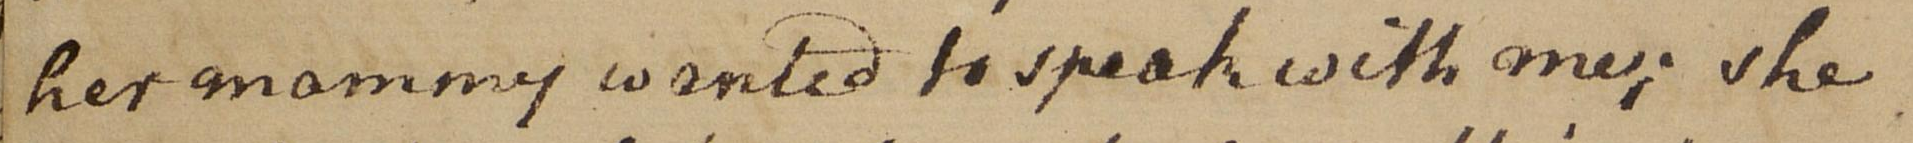her mammy wanted to speak with me; she
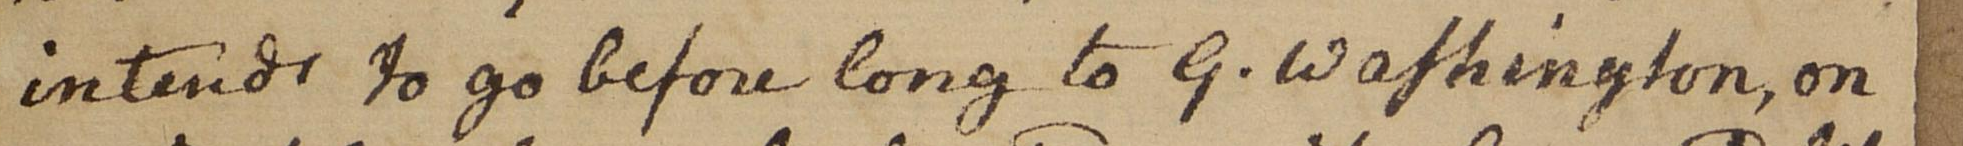intends to go before long to G. Washington, on
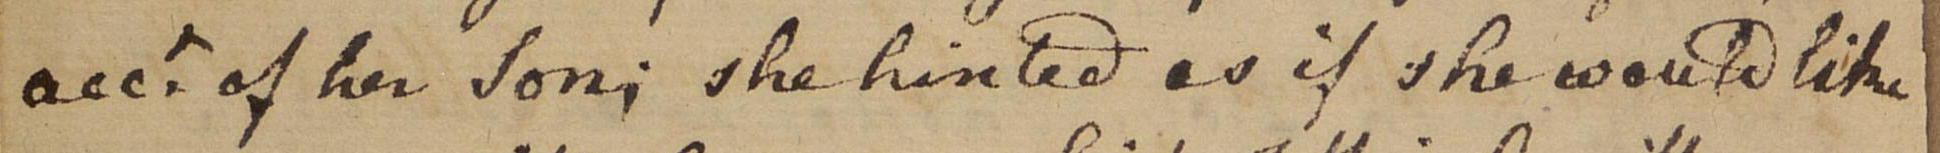acc^t. of her Son; she hinted as if she would like
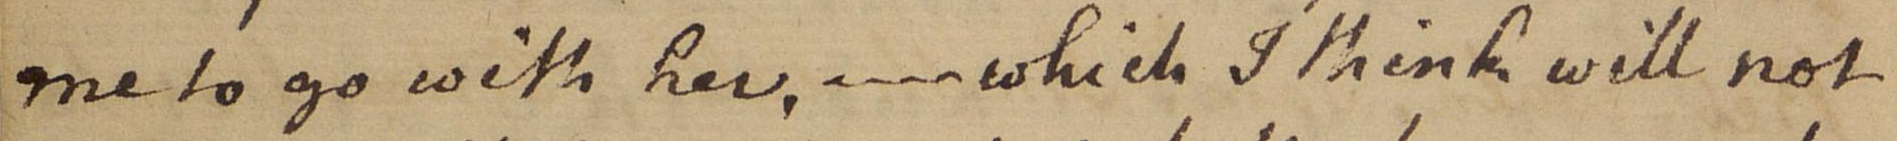me to go with her,- which I think will not
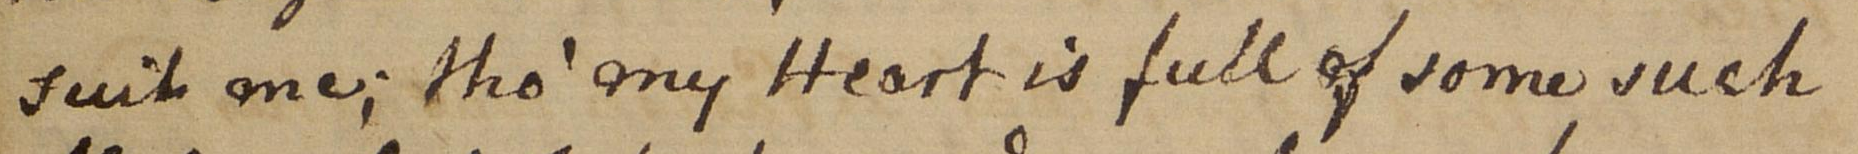suit me; tho' my Heart is full of some such
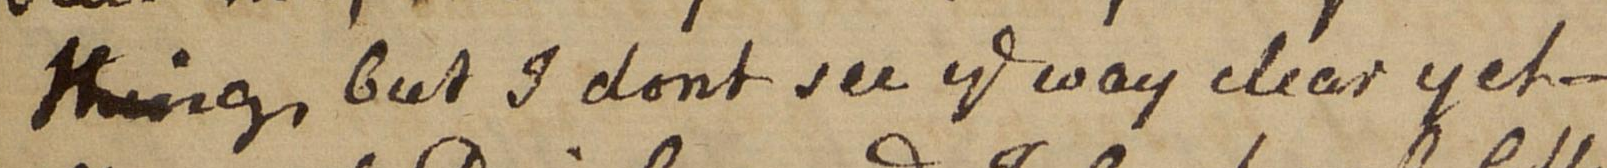thing, but I dont see y^e way clear yet-
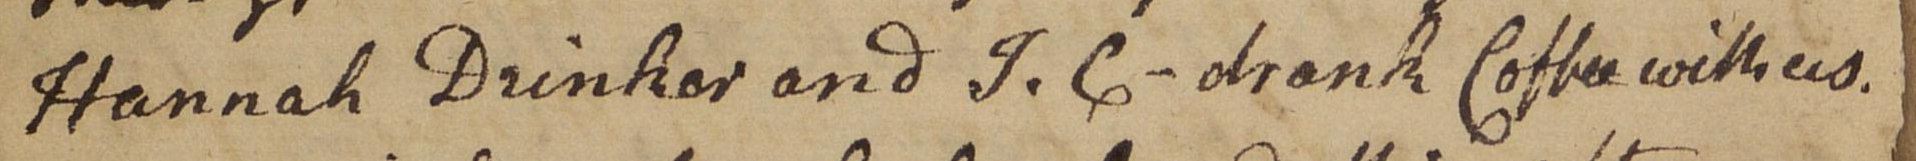Hannah Drinker and J.C- drank Coffee with us.
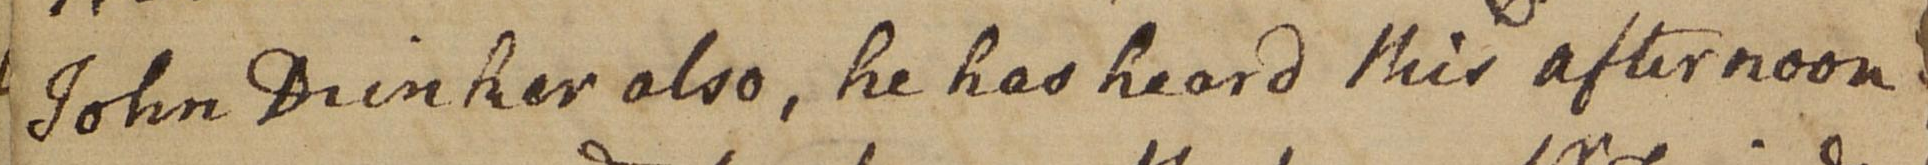John Drinker also, he has heard this afternoon
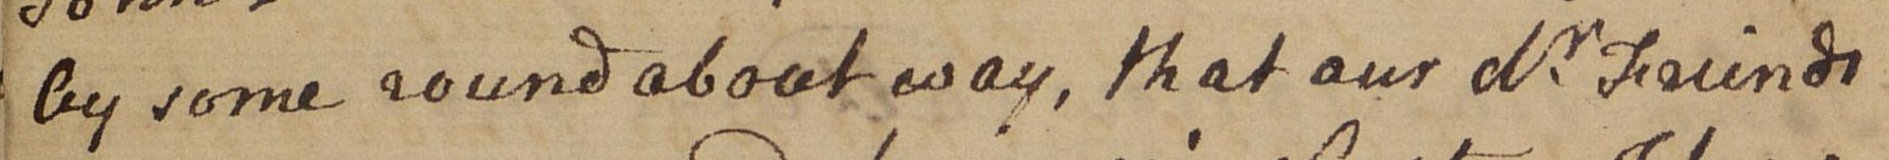by some round about way, that our d^r. Friends
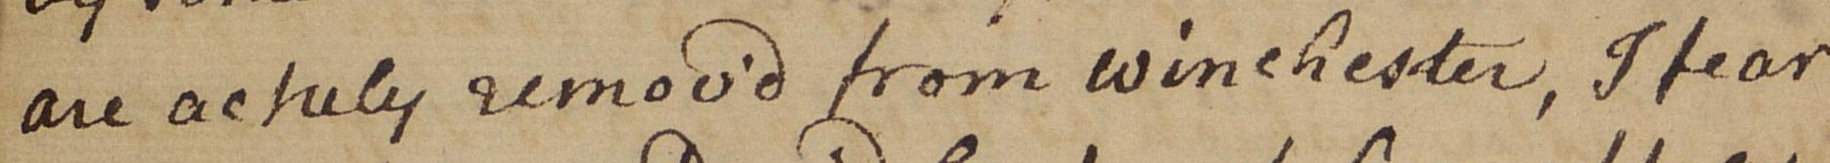are actuly remov'd from Winchester, I fear
